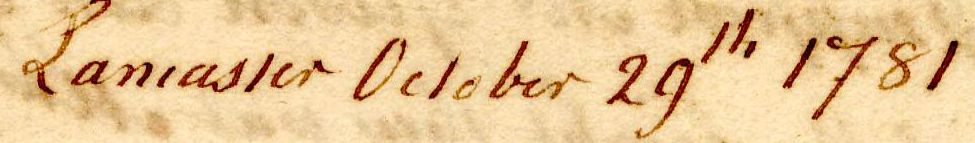Lancaster October 29^th 1781
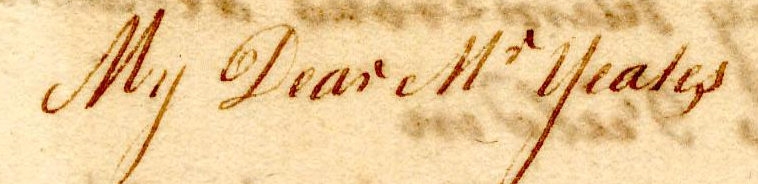My Dear M^r Yeates
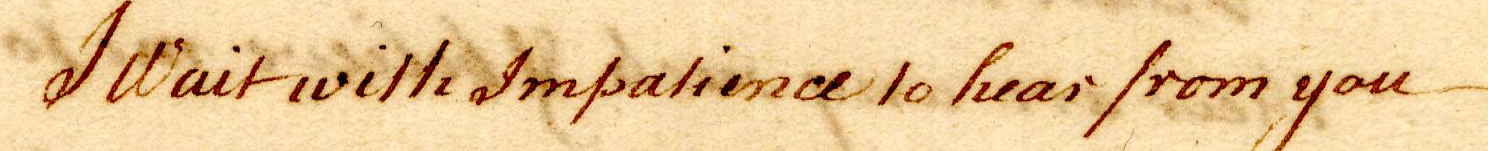I Wait with Impatience to hear from you
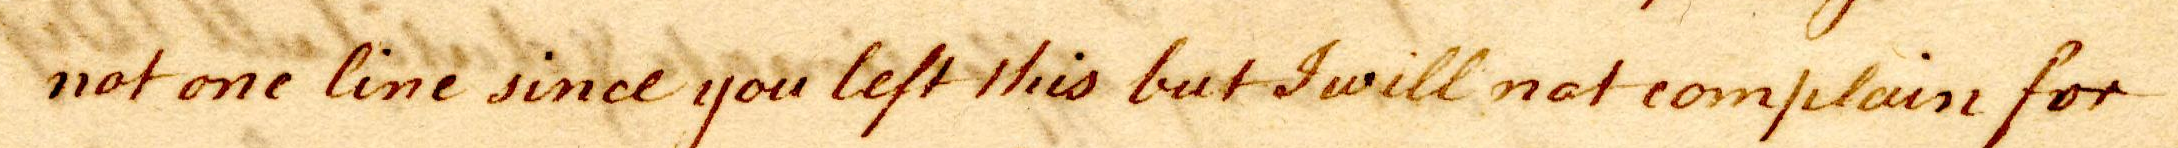not one line since you left this but I will not complain for
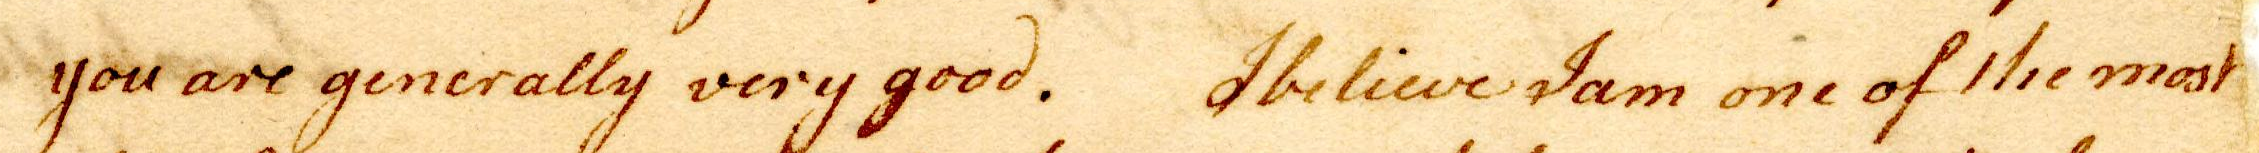you are generally very good. I believe I am one of the most
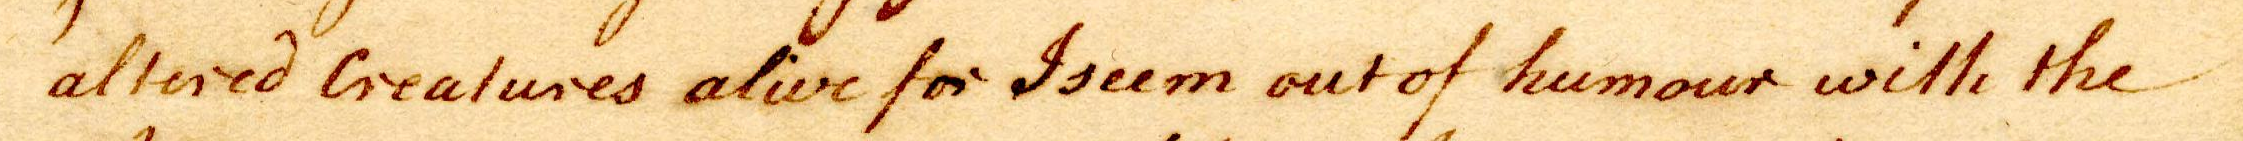altered creatures alive for I seem out of humour with the
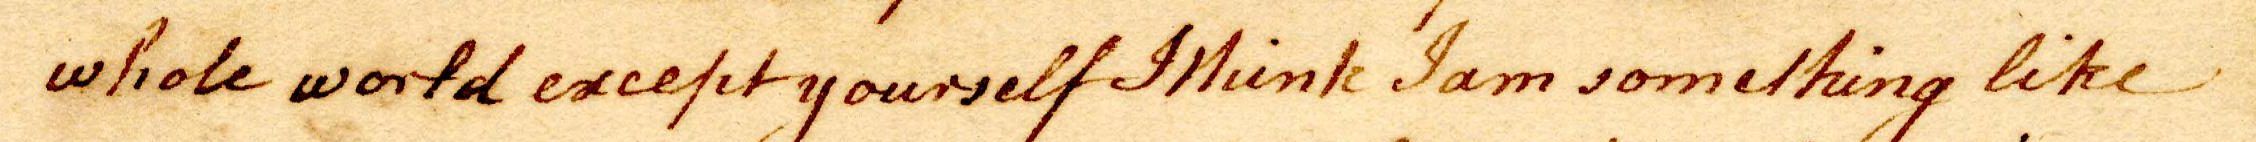whole world except yourself I think I am something like
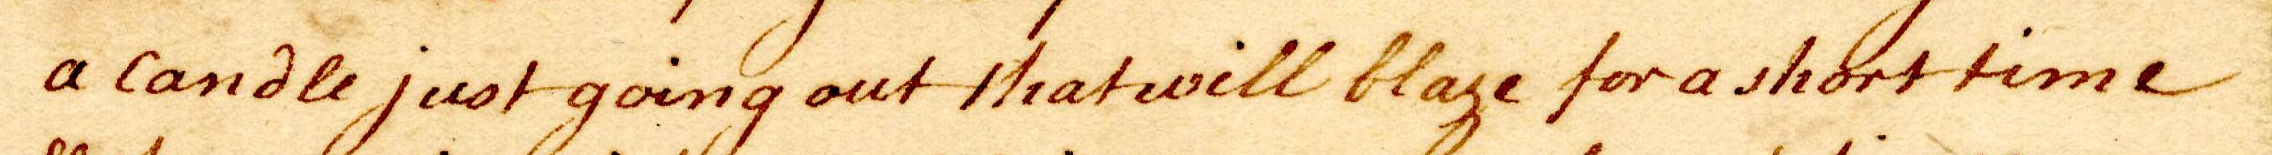a candle just going out that will blaze for a short time
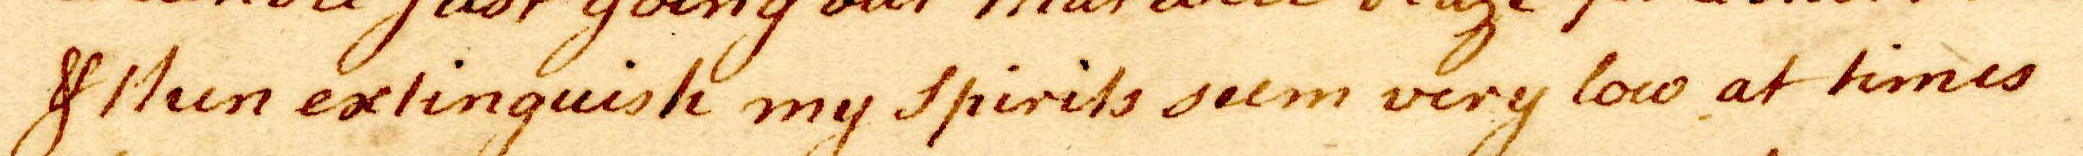& then extinguish my Spirits seem very low at times
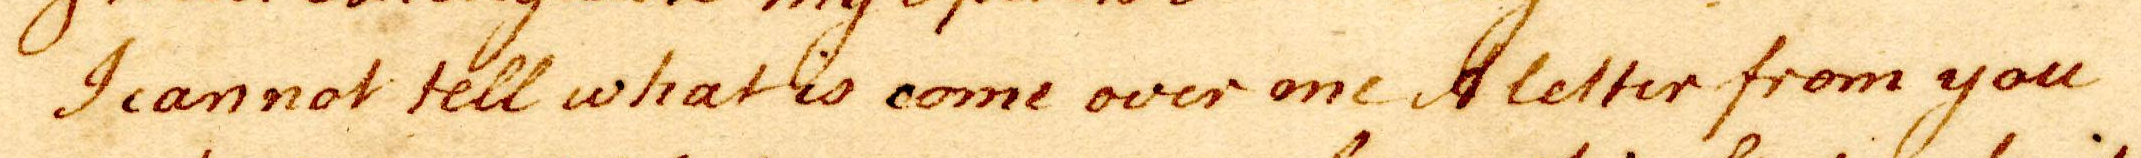I cannot tell what is come over one A letter from you
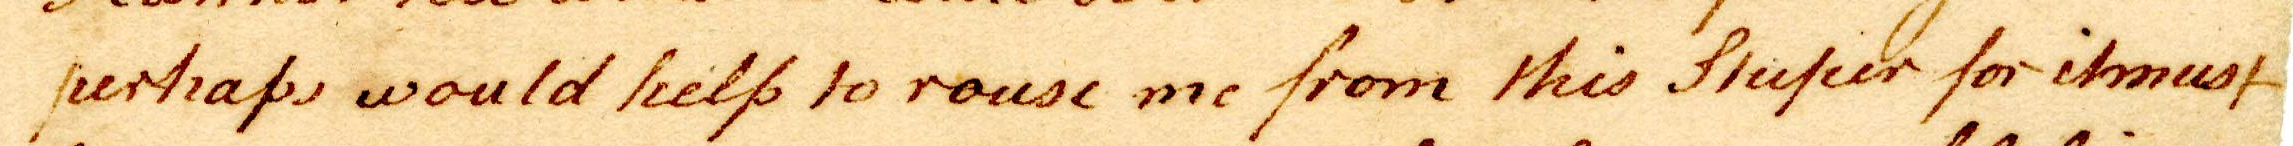perhaps would help to rouse me from this Stuper for it must
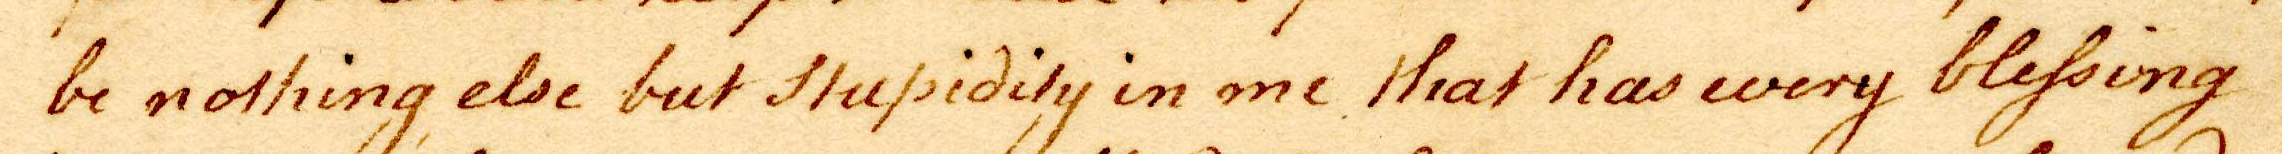be nothing else but stupidity in me that has every blessing
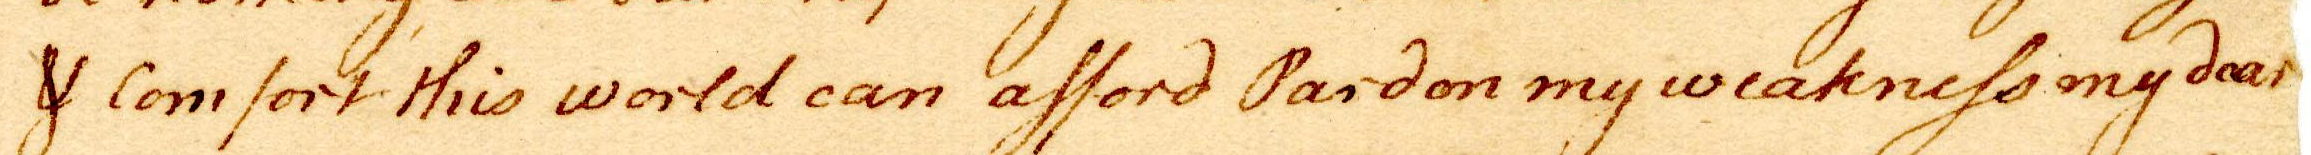& Comfort this world can afford Pardon my weakness my dear
